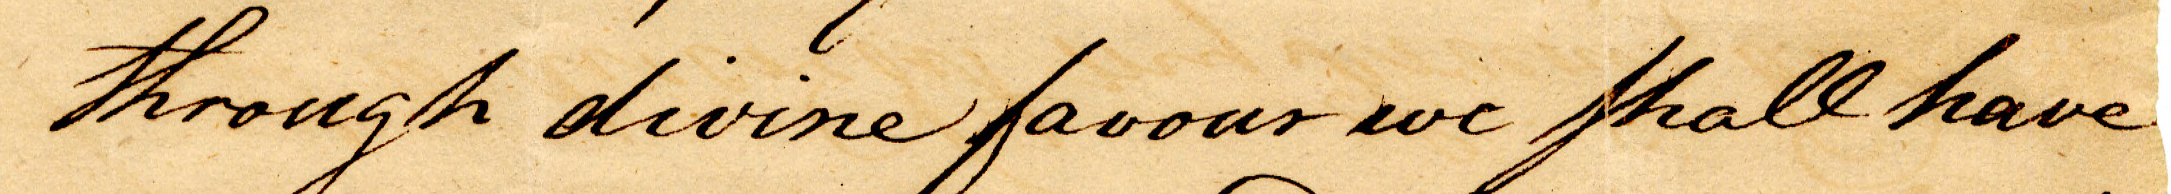through divine favour we shall have
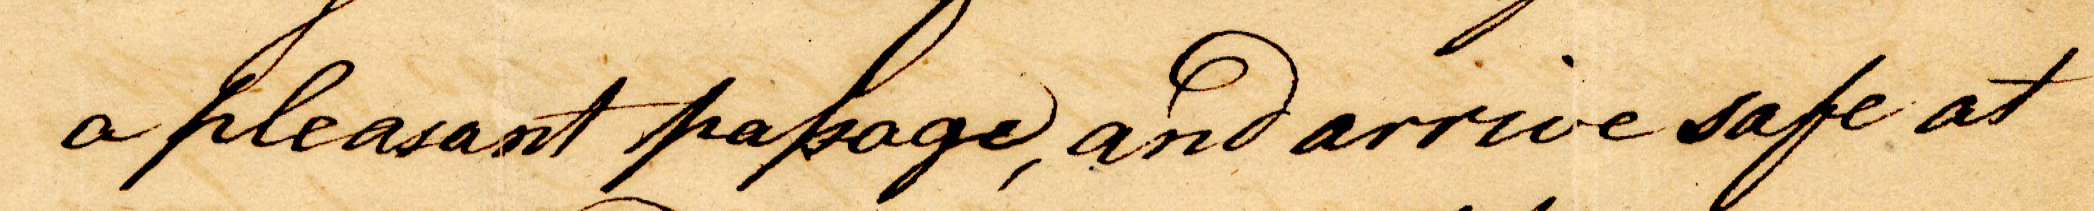a pleasant passage, and arrive safe at
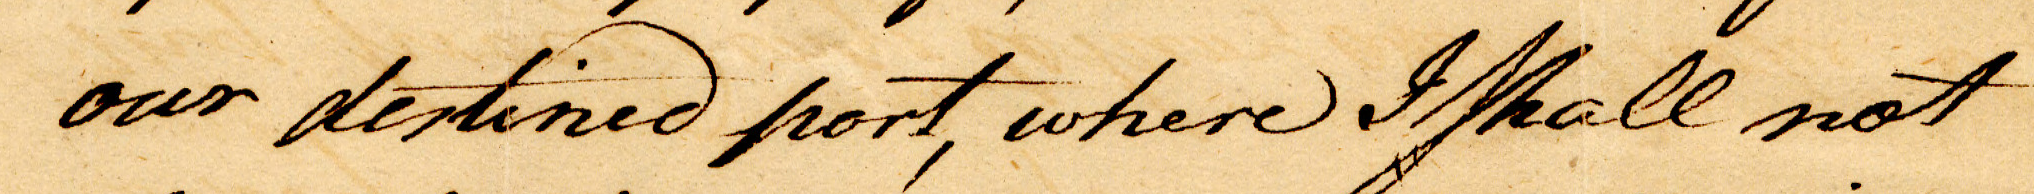our destined port, where I shall not
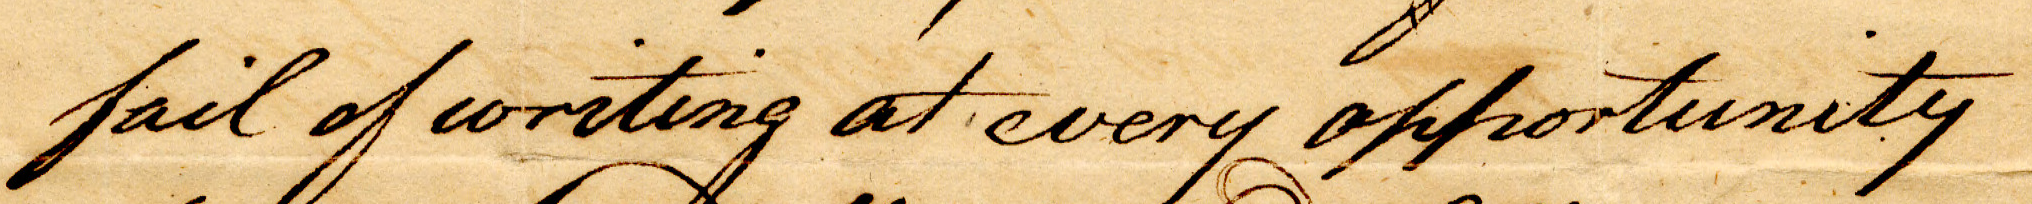fail of writing at every opportunity
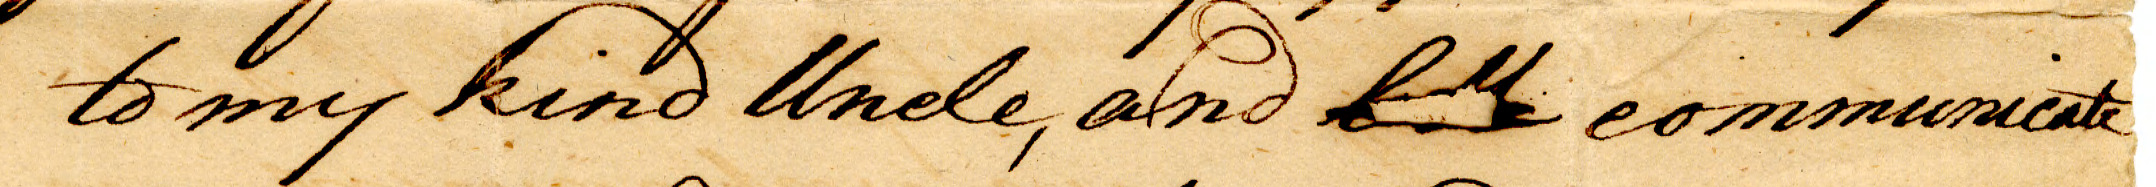to my kind Uncle, and [____] communicate
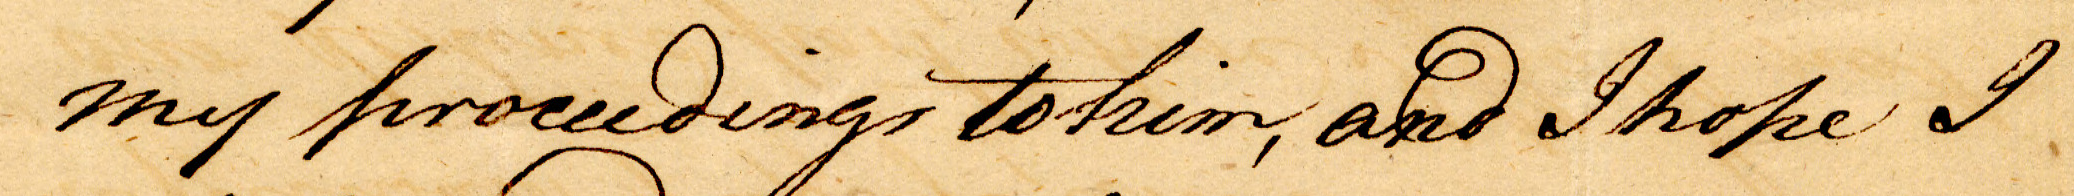my proceedings to him, and I hope I
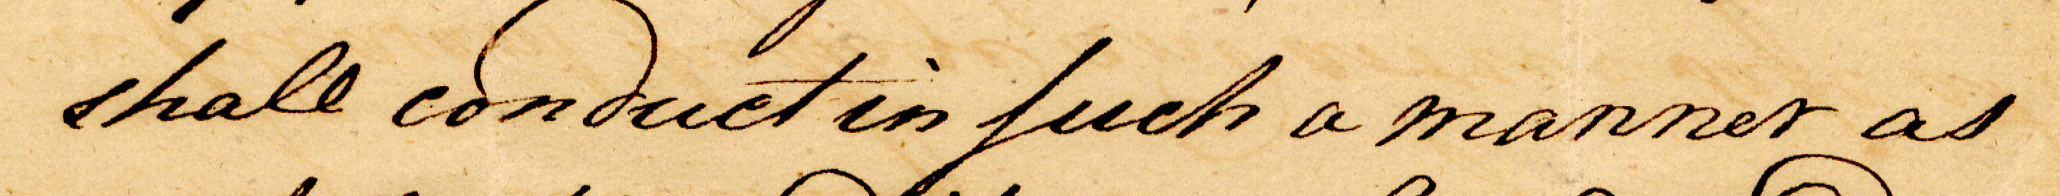shall conduct in such a manner as
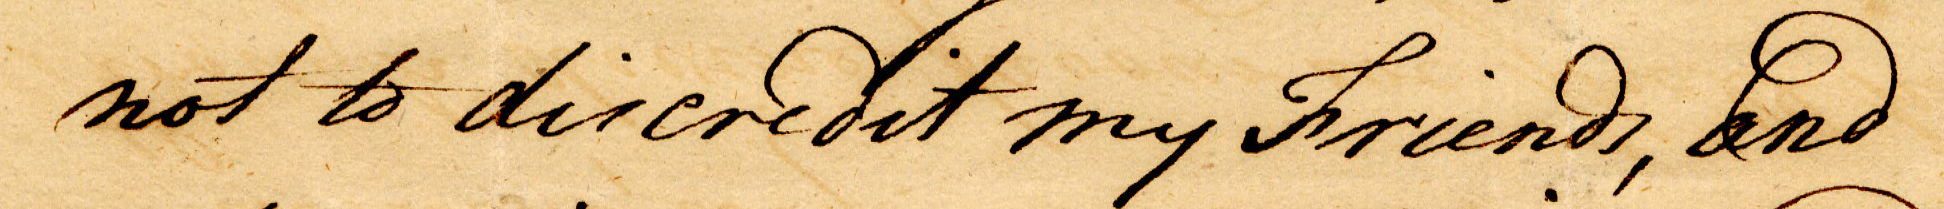not to discredit my Friends, and
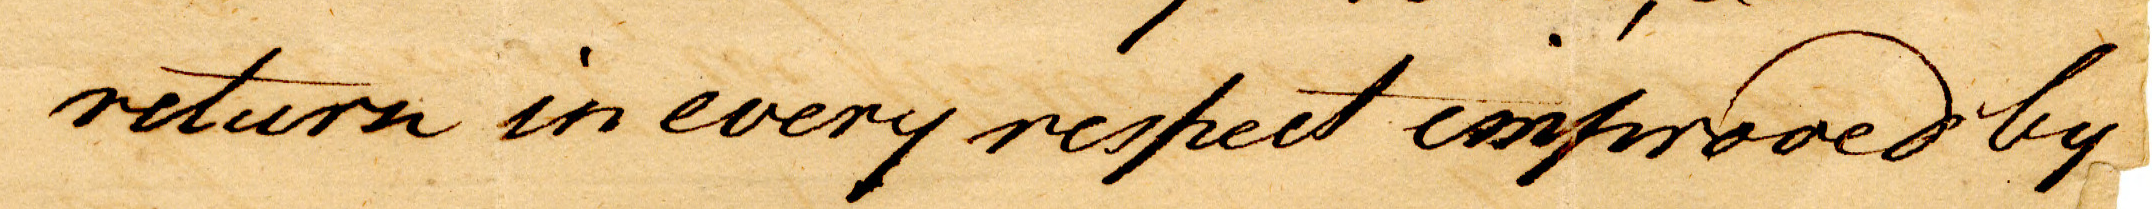return in every respect improved by
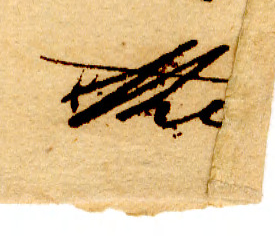the
